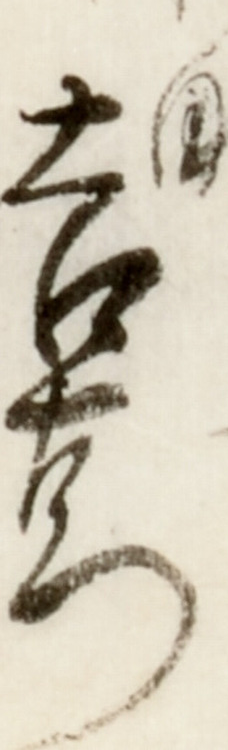吉左衛門
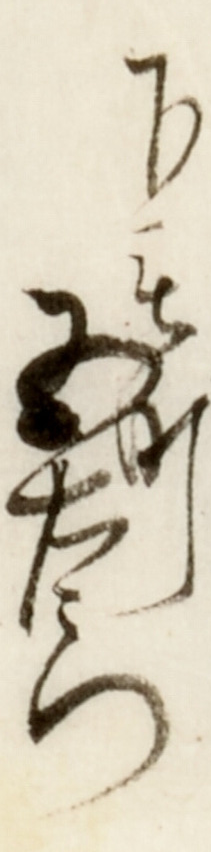下七町
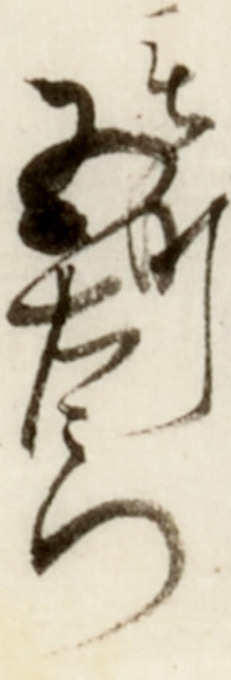吉左衛門
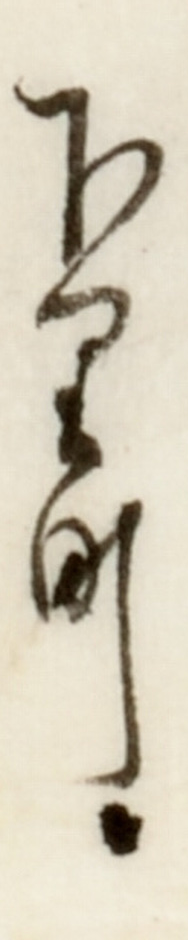下七町
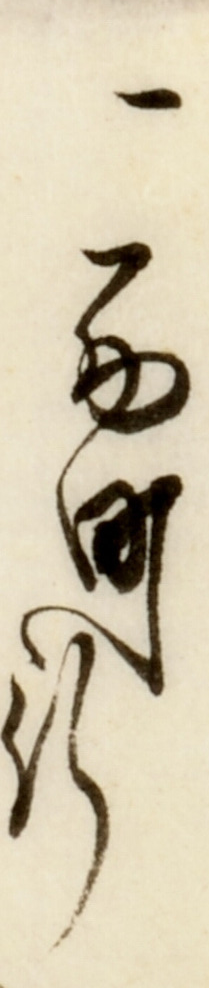一西町行
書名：役配人足割合帳
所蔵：伊那市立高遠町図書館・合同会社AMANE
